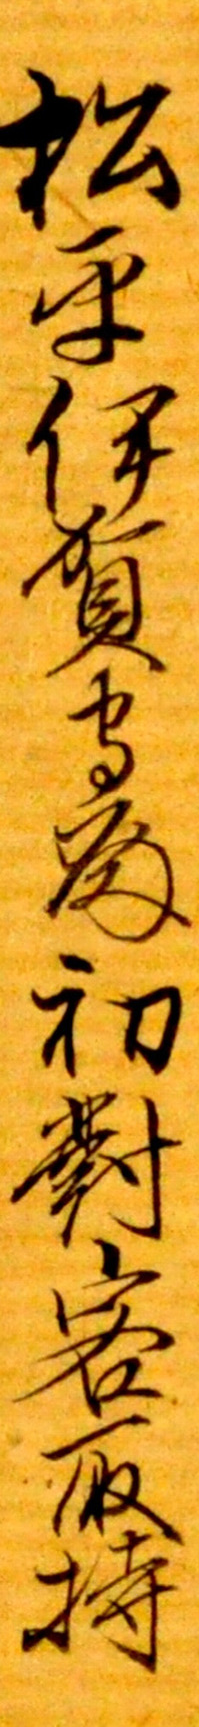松平伊賀守殿初対客取持
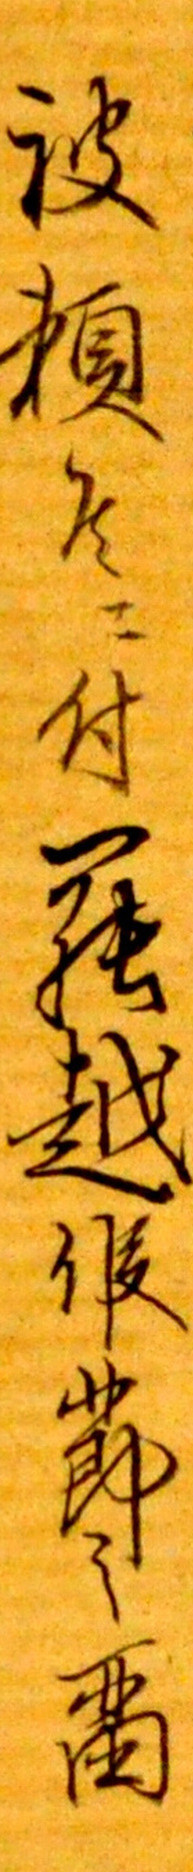被頼候ニ付罷越候節之留

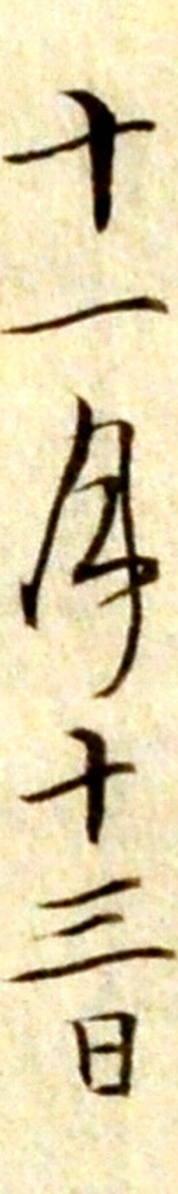十一月十三日
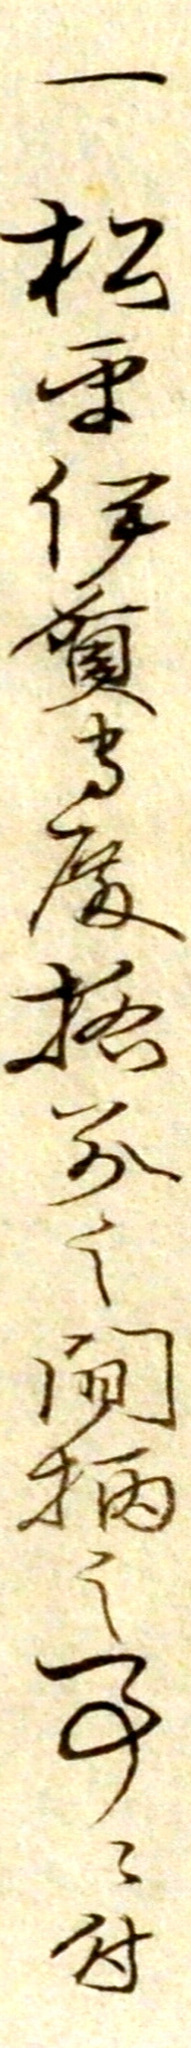一松平伊賀守殿格別之間柄之事ニ付
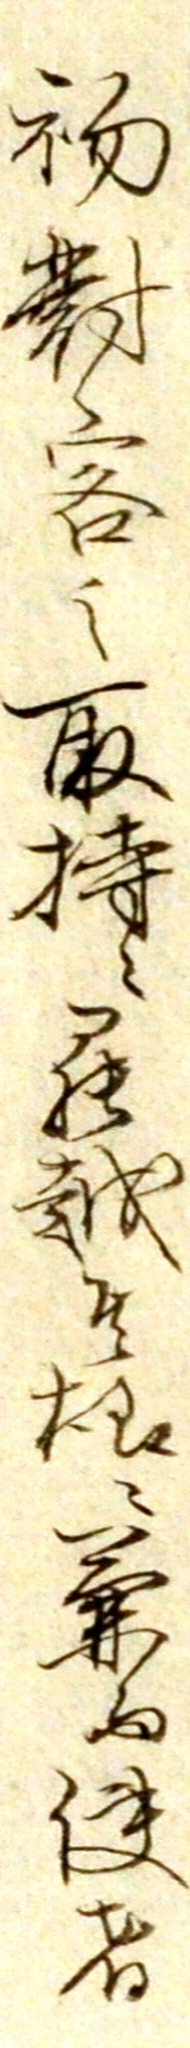初対客之取持ニ罷越候様ニ兼而使者
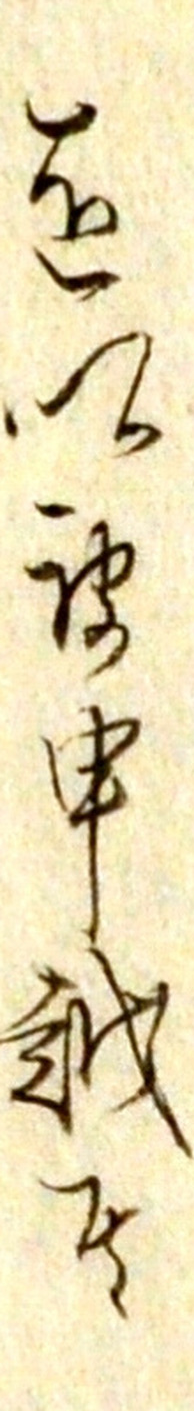を以被申越候
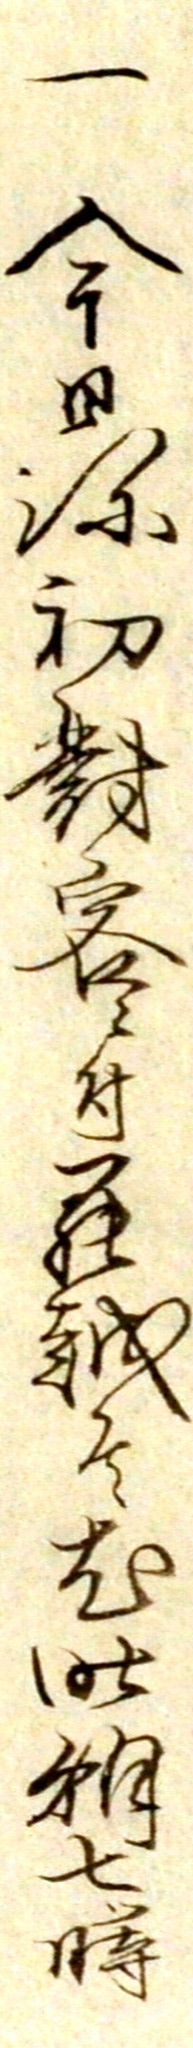一今日弥初対客ニ付罷越候尤昨朝七ツ時
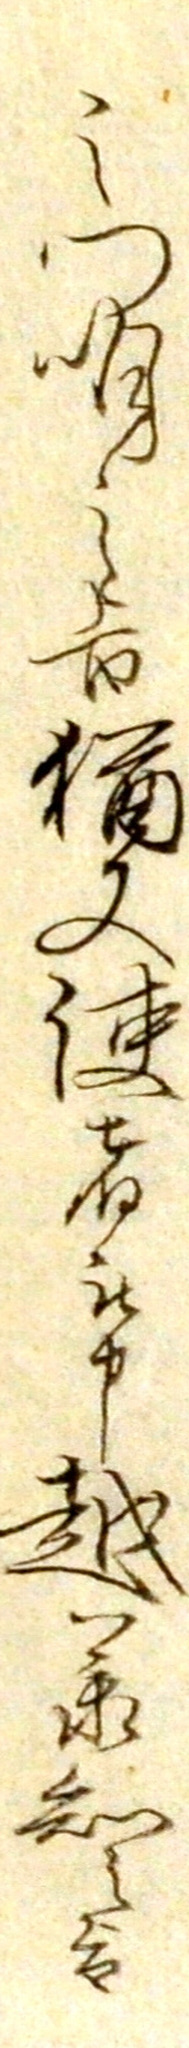之門明之旨猶又使者被申越承知之旨
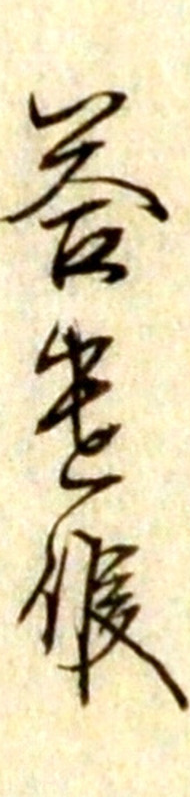答遣候
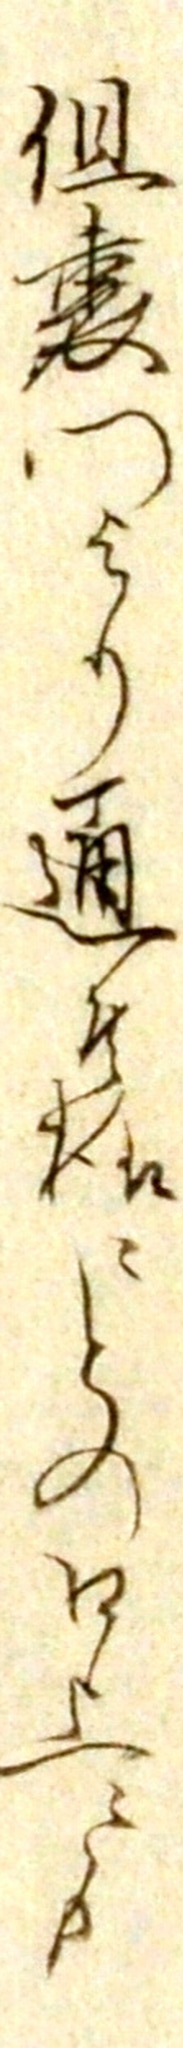但裏門より通候様ニとの口上ニ候
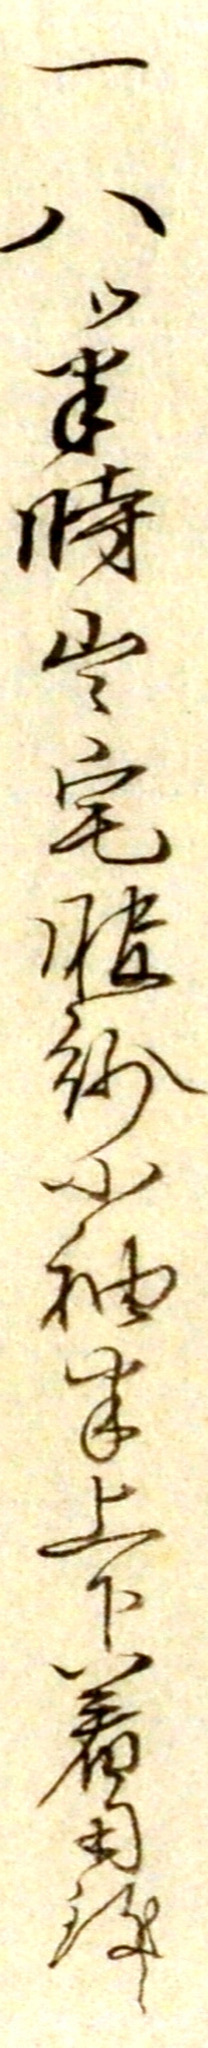一八ツ半時出宅服紗小袖半上下着用致し
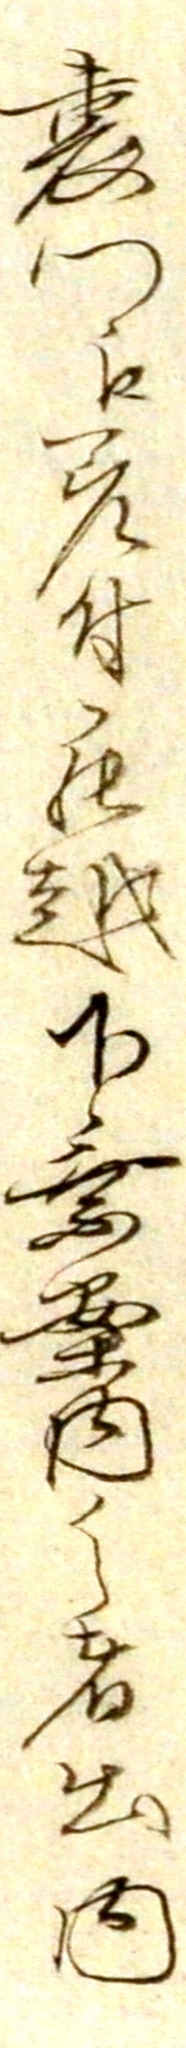裏門え差付罷越下乗案内之者出内
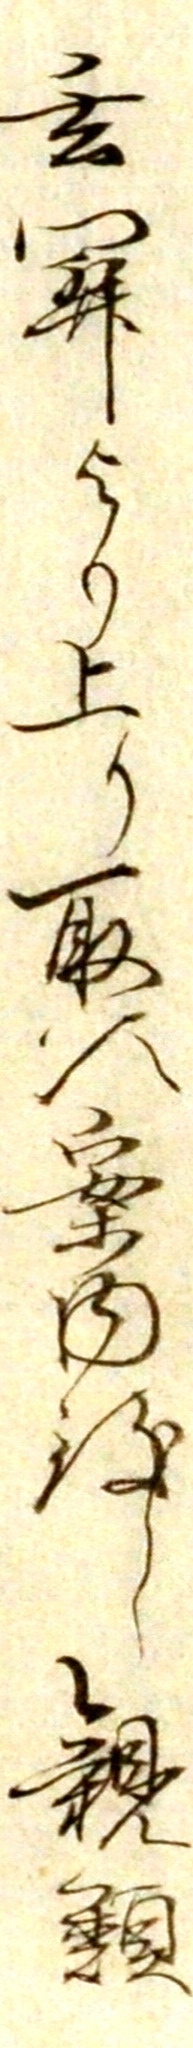玄関より上り取次案内致し親類

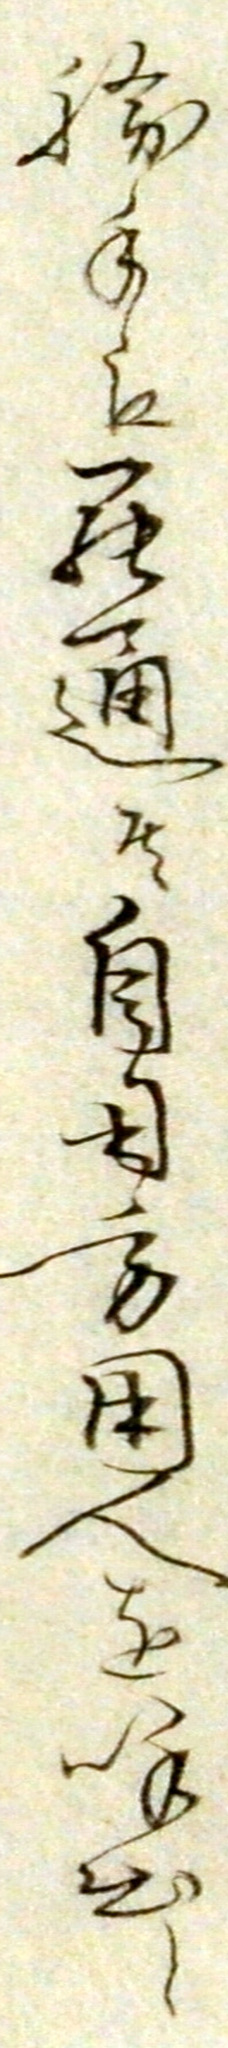勝手え罷通候自用方用人を呼出し
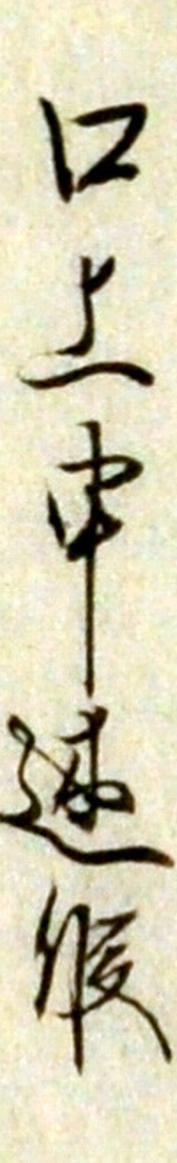口上申述候
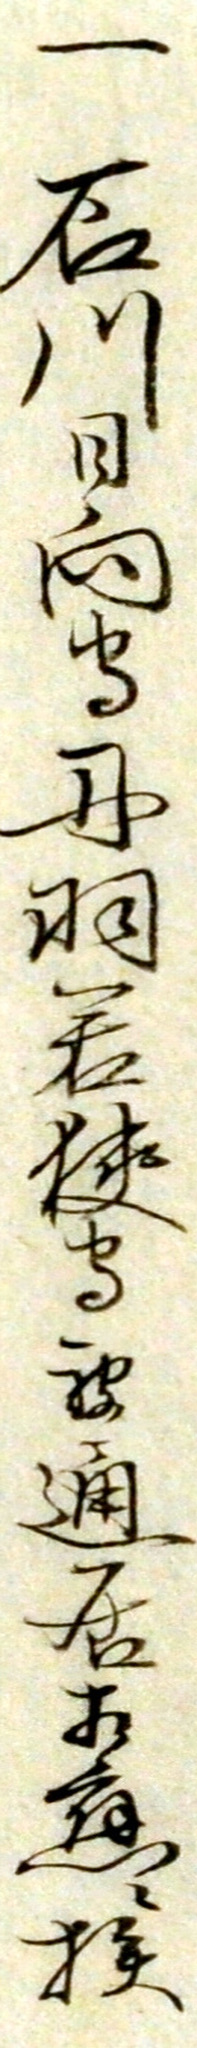一石川日向守丹羽若狭守被通居相応ニ挨
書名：諸名代相勤候節ノ留書外
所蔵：伊那市立高遠町図書館・合同会社AMANE
